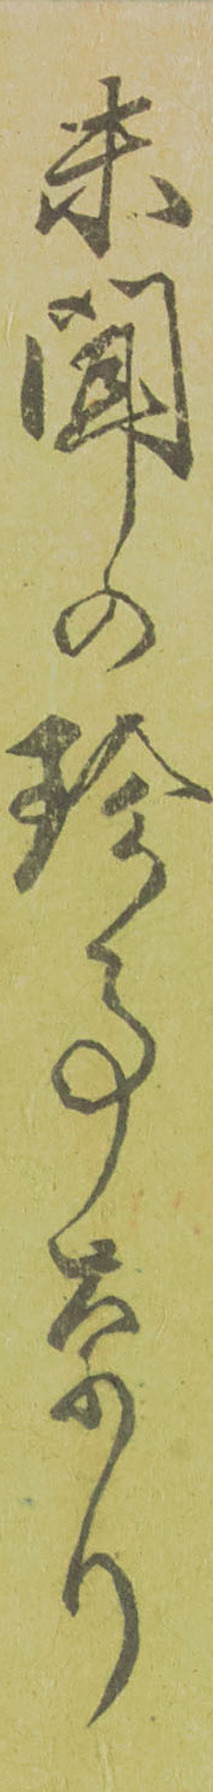未聞の珍事なり
